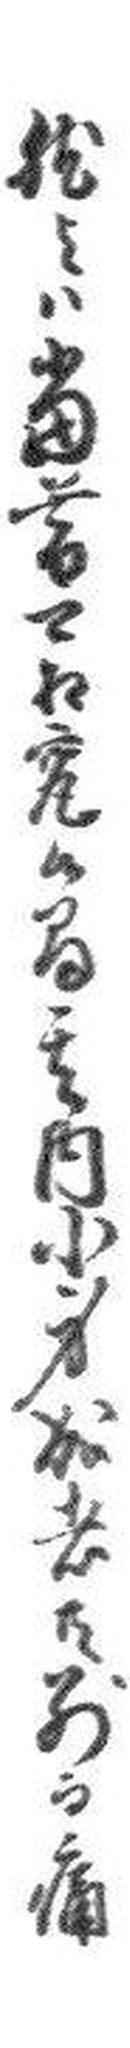然とハ当暮可相究候間其内小身成者共別而痛
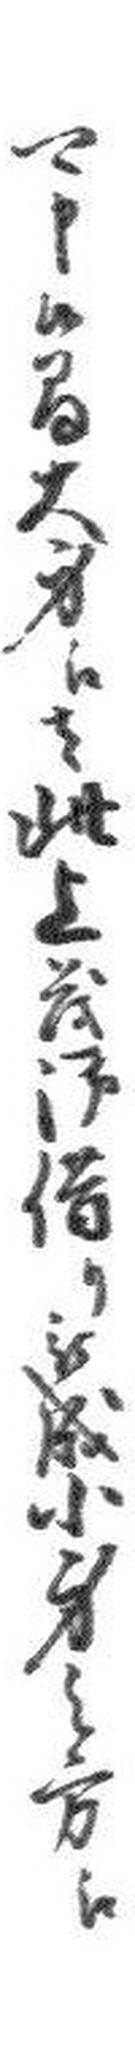可申候間大身江者此上も御借リ被成小身之方江
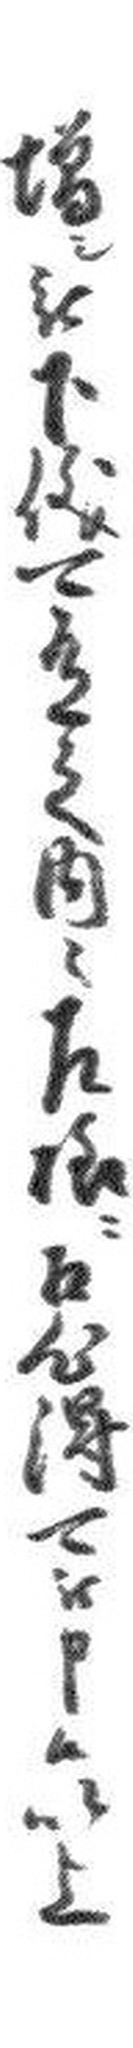増シ被下儀可有之内々左様ニ相心得可被申候以上
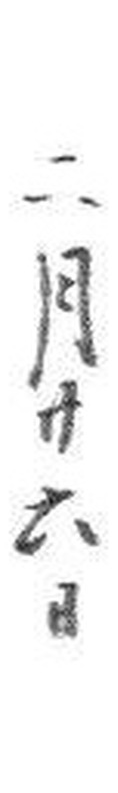二月廿六日
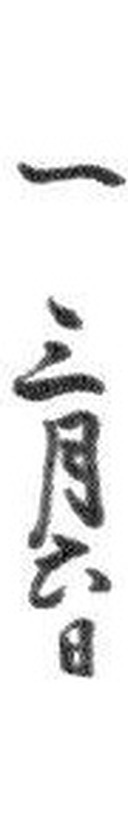一三月六日
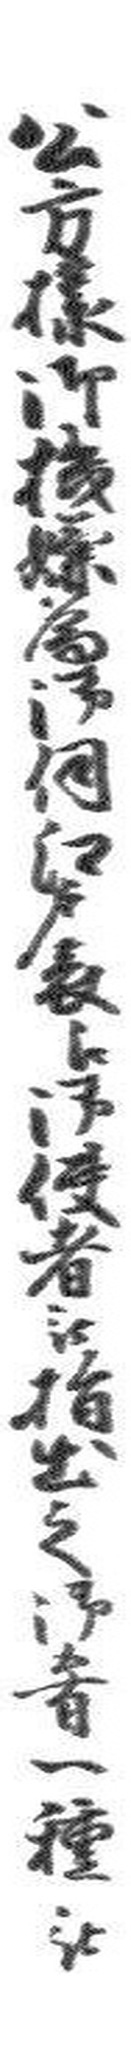公方様御機嫌為御伺江戸表江御使者被指出之御肴一種被
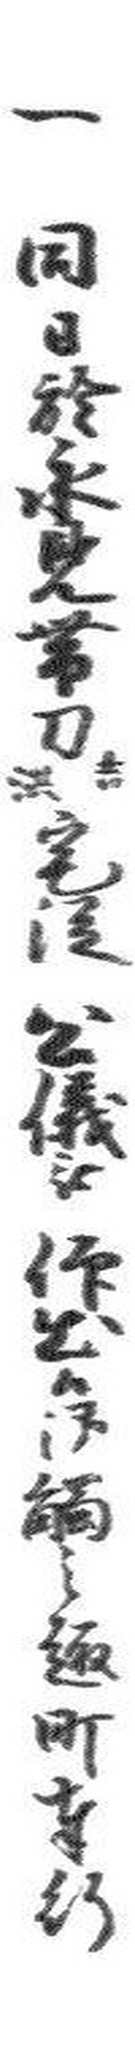一同日於永見帯刀吉洪宅従公儀被仰出候御触之趣町奉行
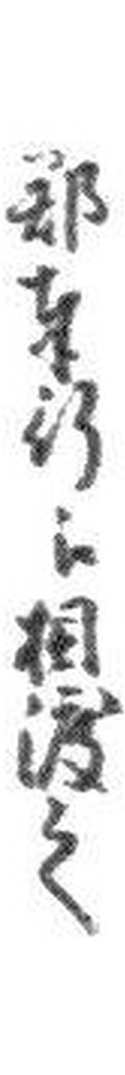郡奉行江相渡之

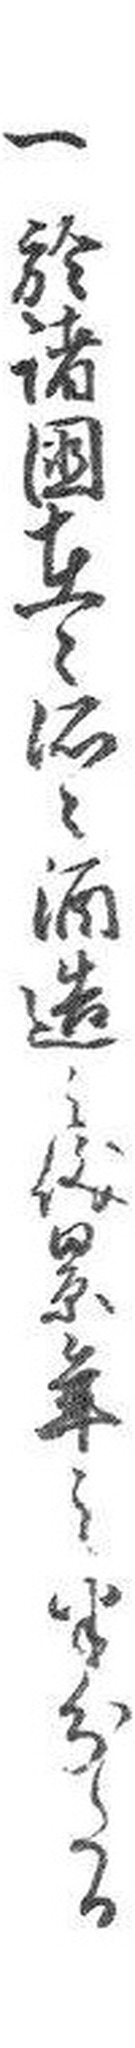一於諸国在々所々酒造之儀累年之半分たる
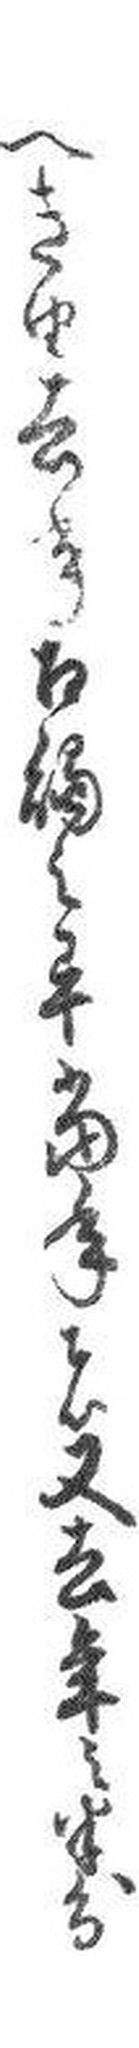へき由去年相触之畢当年者又去年之半分
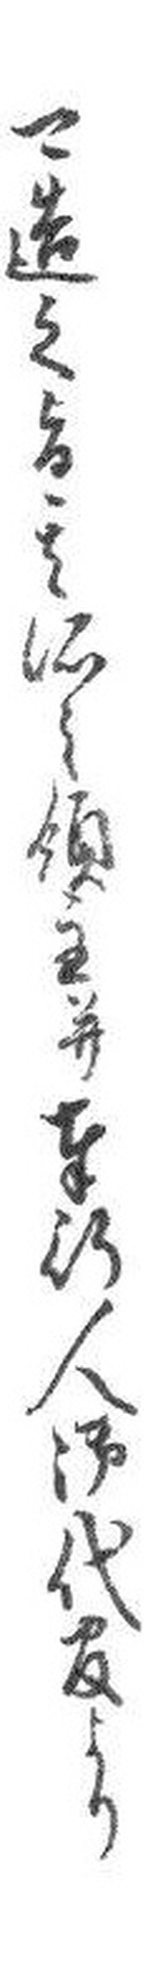可造之旨其所之領主并奉行人御代官より
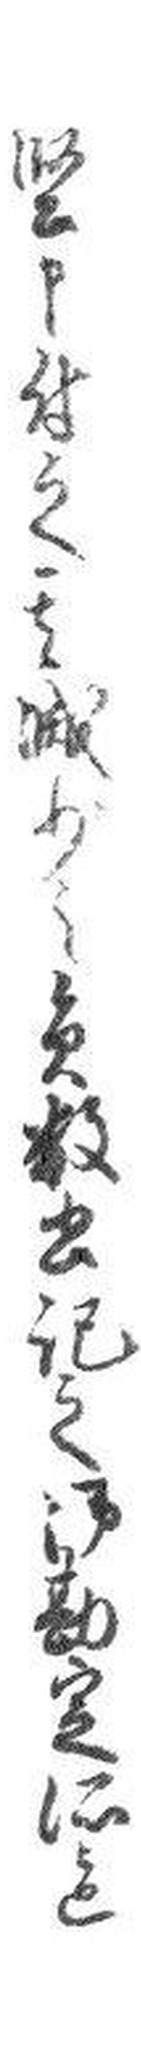堅申付之其減少之員数書記之御勘定所迄
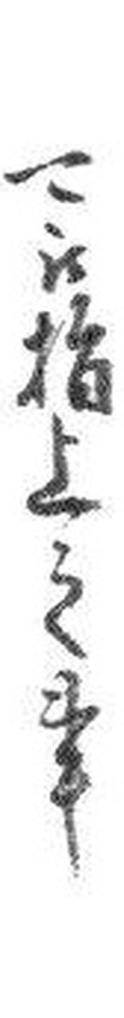可被指上之事
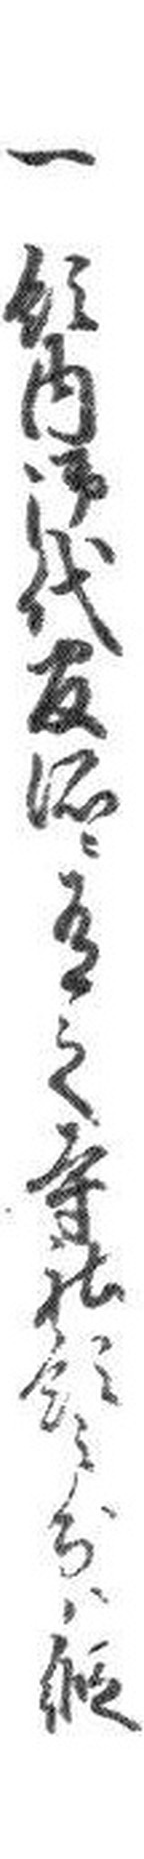一領内御代官所ニ有之寺社領之分ハ縦
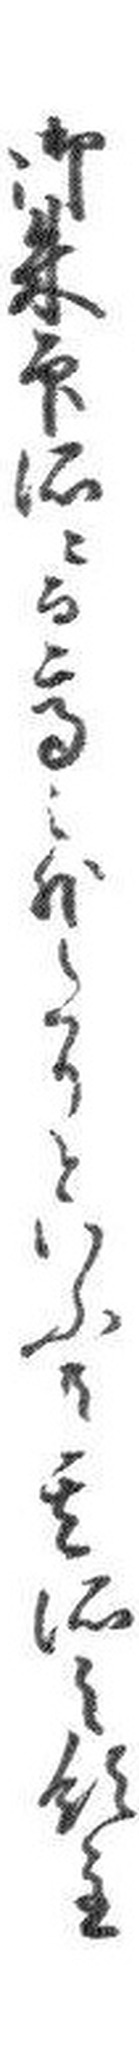御朱印所ニ而高之外たりといふ共其所之領主
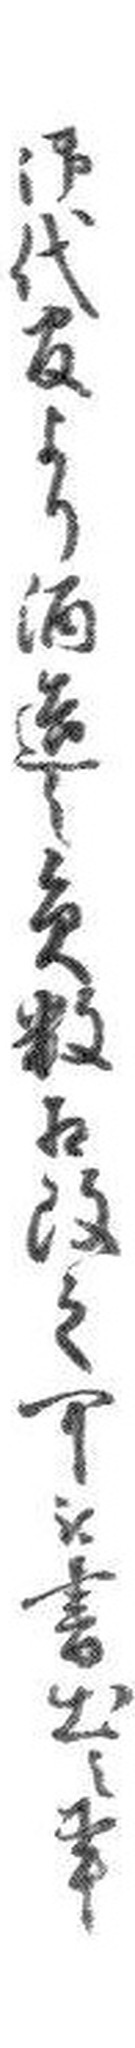御代官より酒造之員数相改之可被書出之事
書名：家譜 七 光通公 従寛文四年到同九年
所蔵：福井県文書館 Fukui Prefectural Archives
